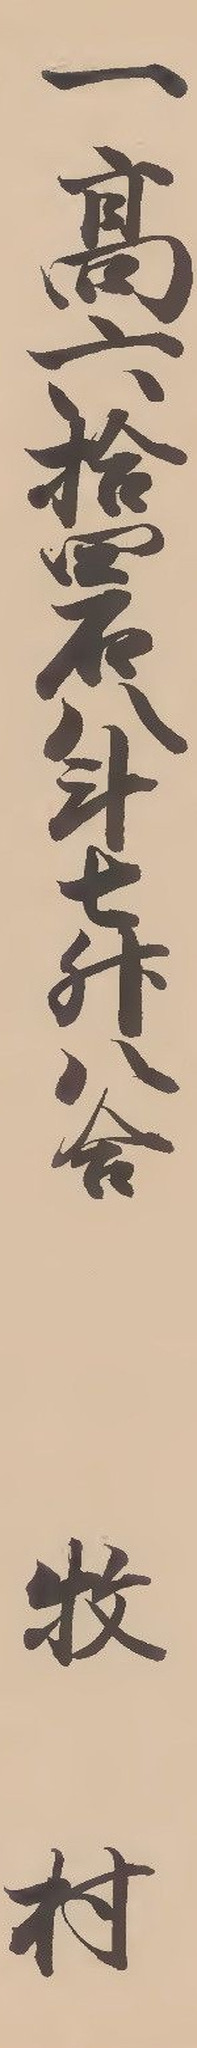一高六拾四石八斗七升八合牧村
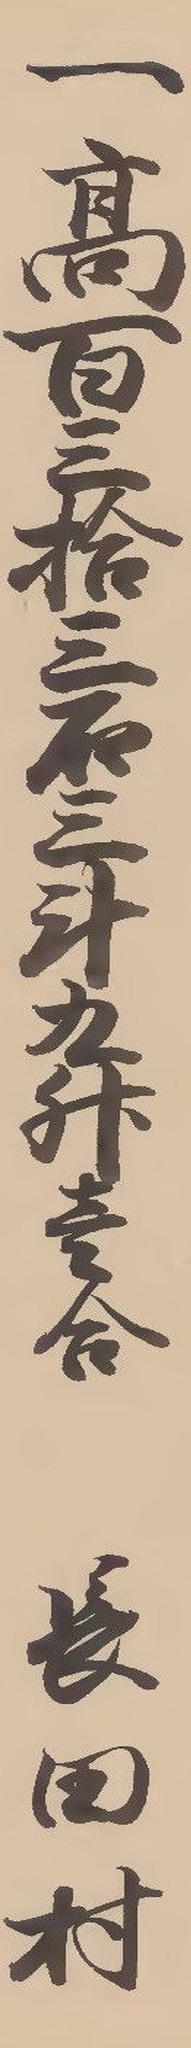一高百三拾三石三斗九升壱合長田村
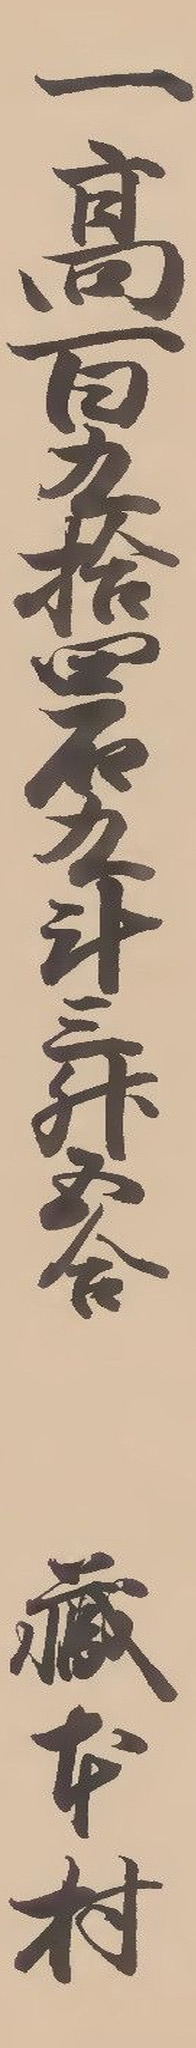一高百九拾四石九斗三升五合蔵本村
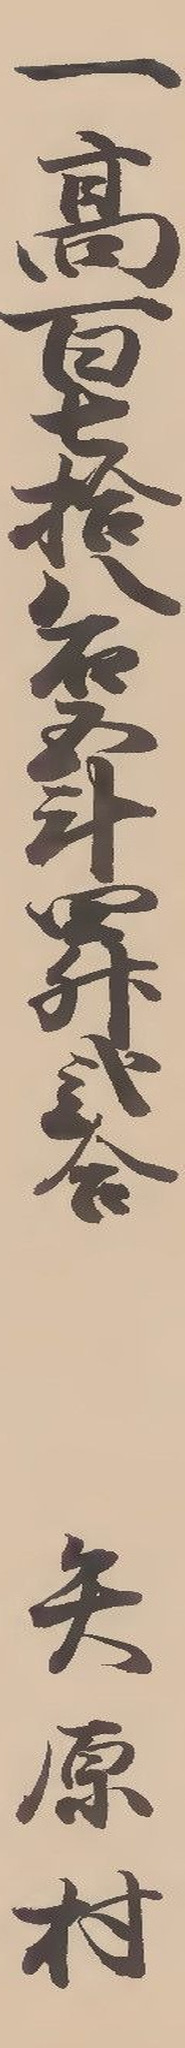一高百七拾八石五斗四升弐合矢原村
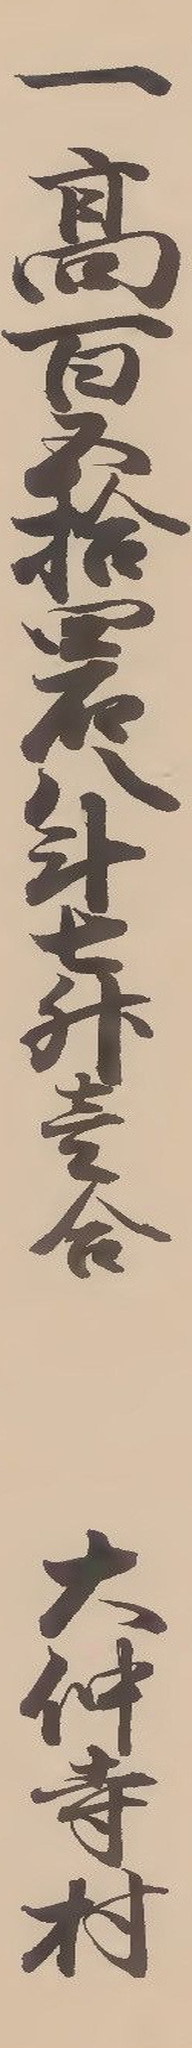一高百五拾四石八斗七升壱合大仲寺村
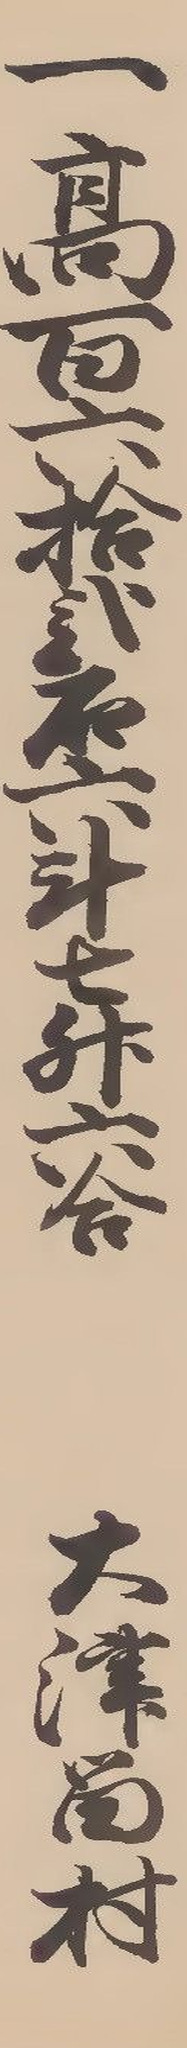一高百六拾弐石六斗七升六合大津留村
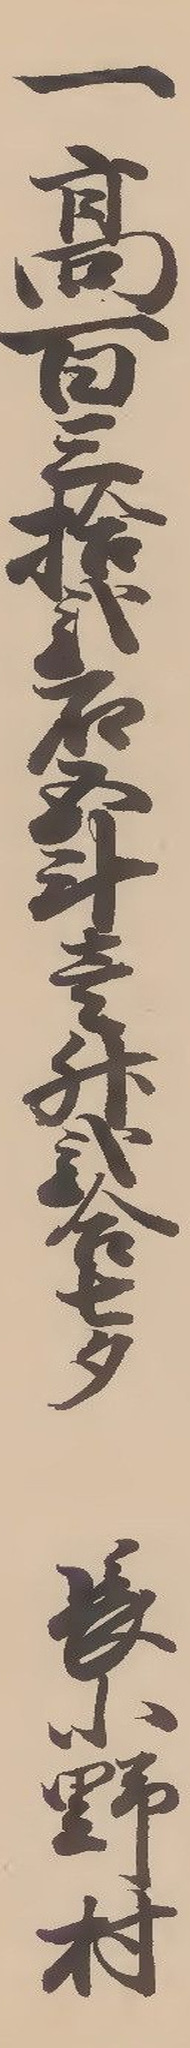一高百三拾弐石五斗壱升弐合七勺長小野村

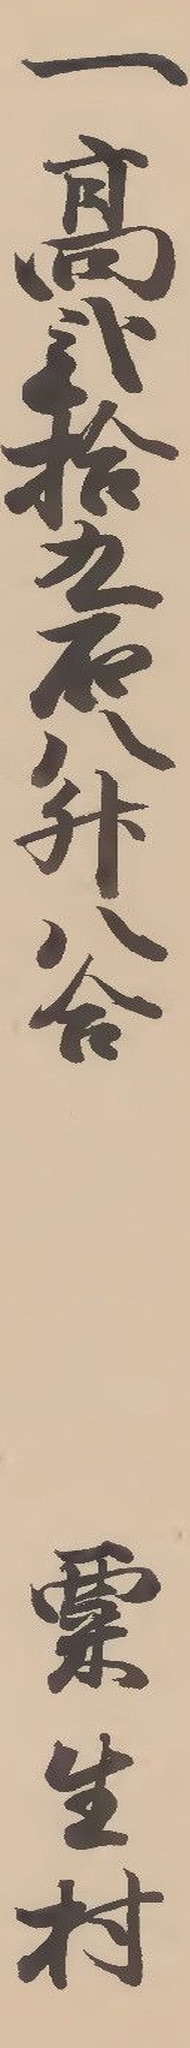一高弐拾九石八升八合粟生村
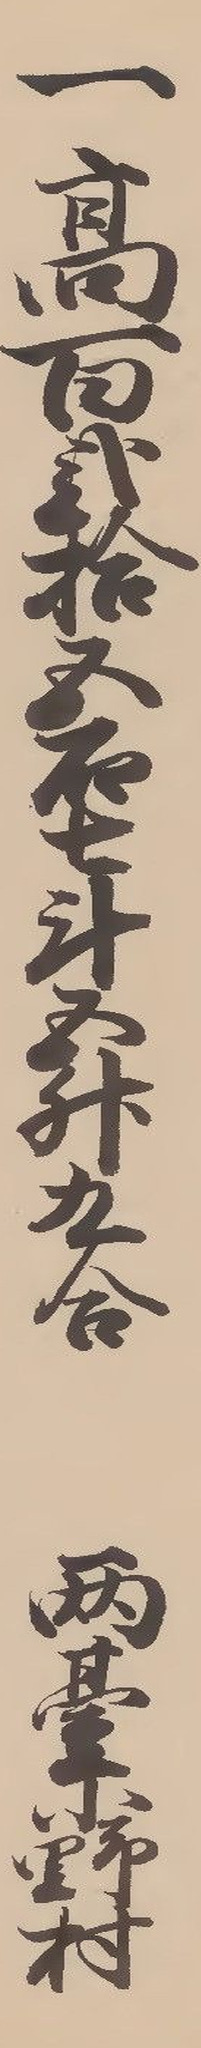一高百弐拾五石七斗五升九合両台小野村
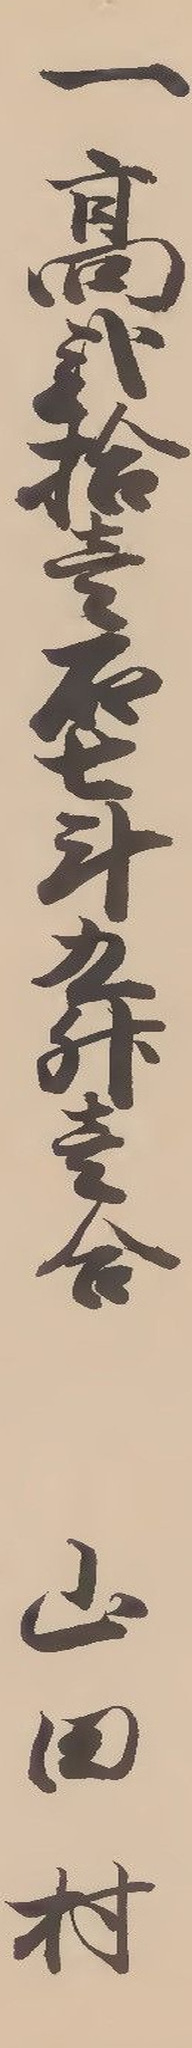一高弐拾壱石七斗九升壱合山田村
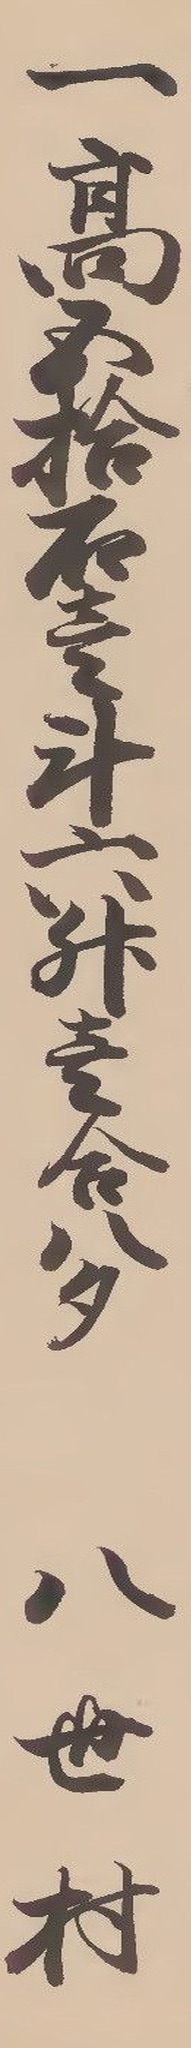一高五拾石壱斗六升壱合八勺八世村
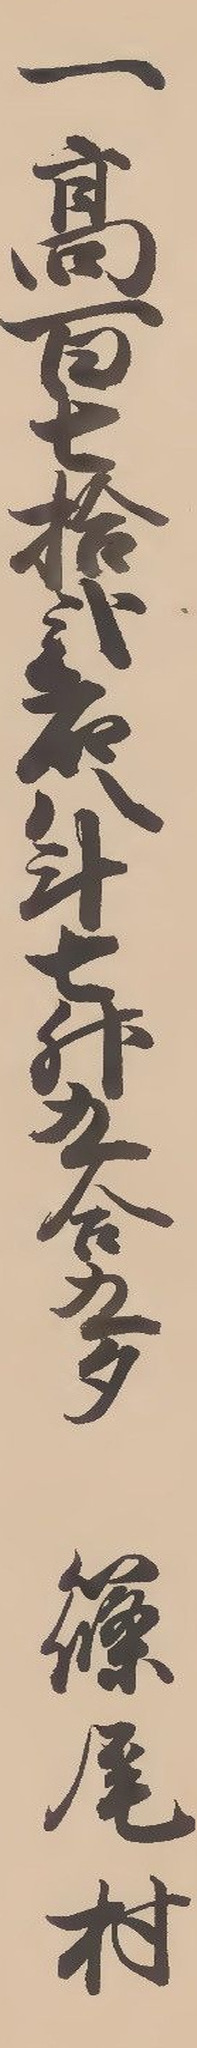一高百七拾弐石八斗七升九合九勺篠尾村
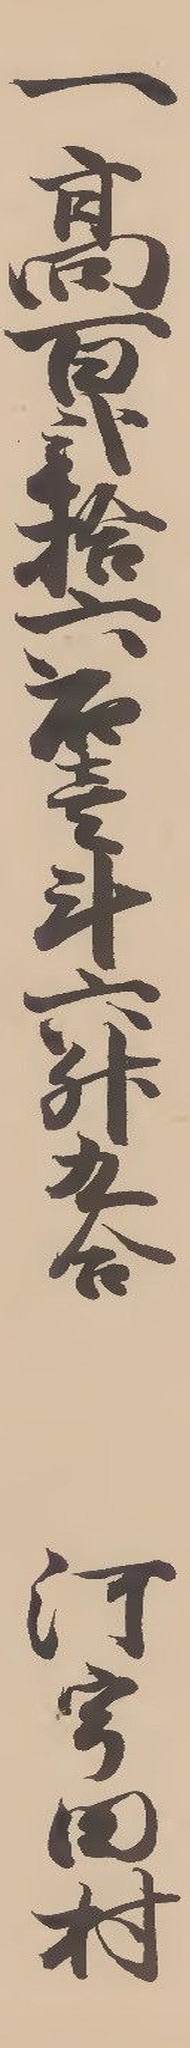一高百弐拾六石壱斗六升九合河宇田村
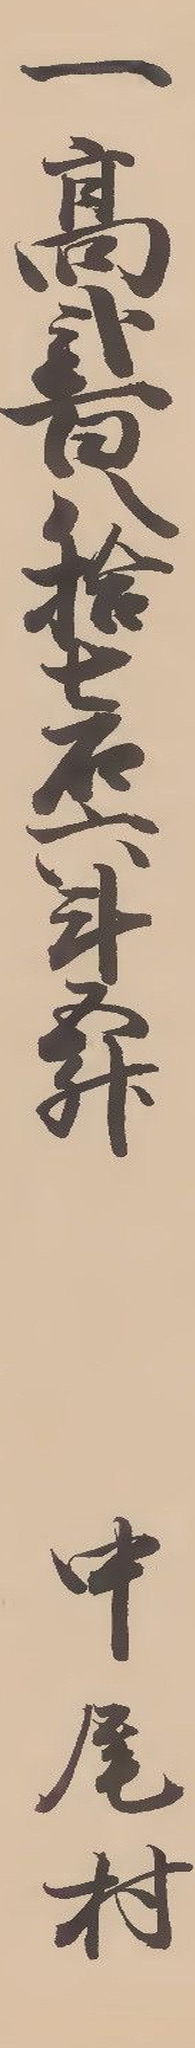一高弐百八拾七石六斗五升中尾村
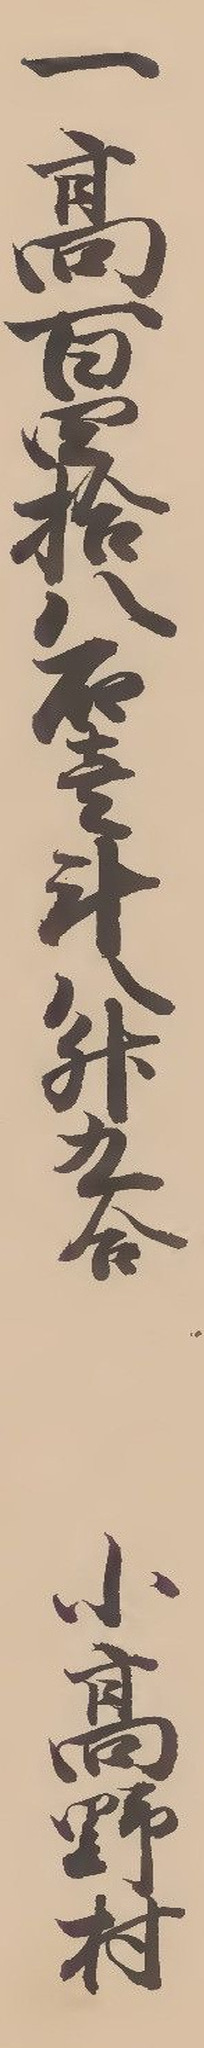一高百四拾八石壱斗八升九合小高野村

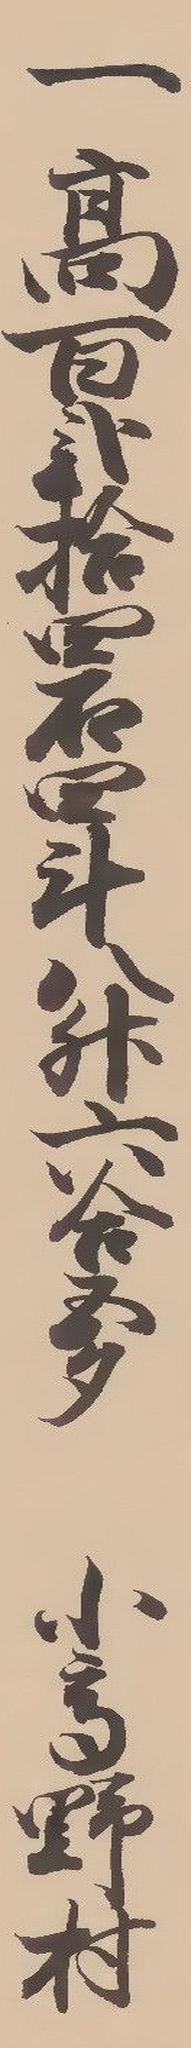一高百弐拾四石四斗八升六合五勺小高野村
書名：豊後国郷帳
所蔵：国立公文書館 National Archives of Japan
